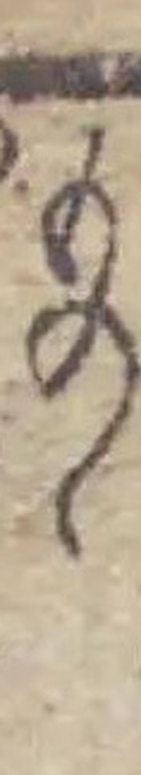ものゝ
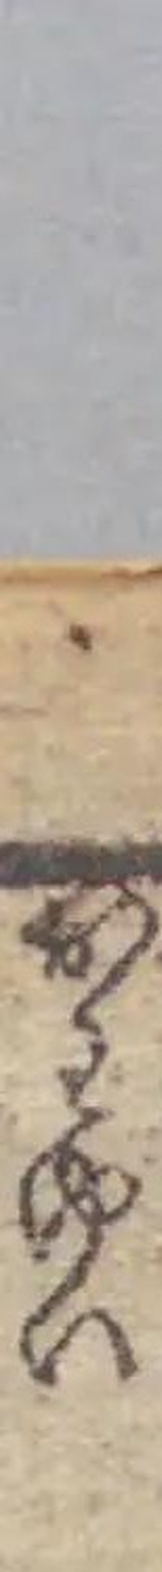かわゆい
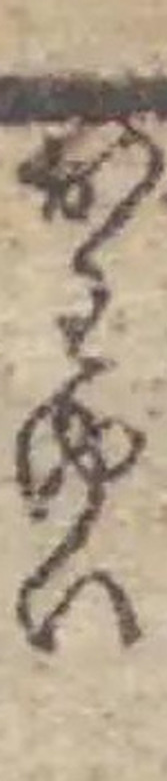かわゆい
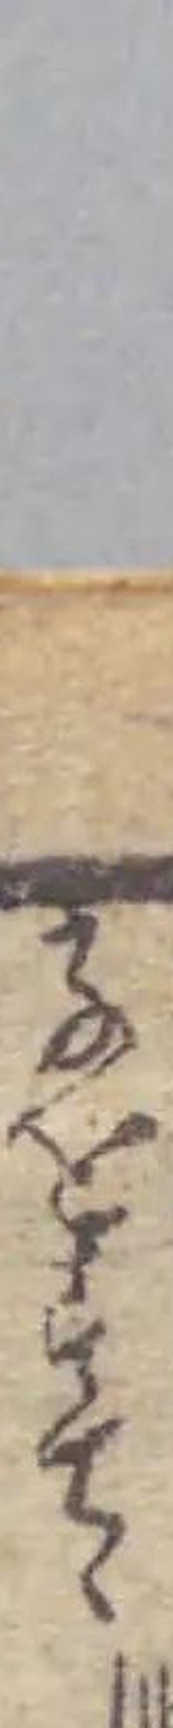子をすてゝ
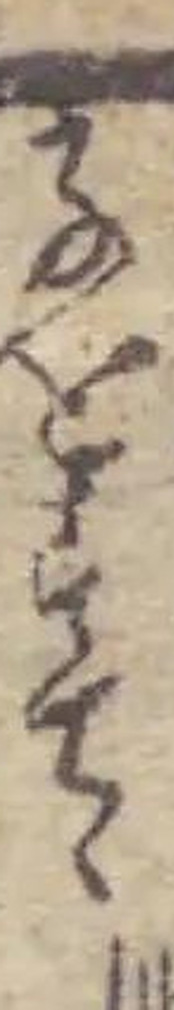子をすてゝ
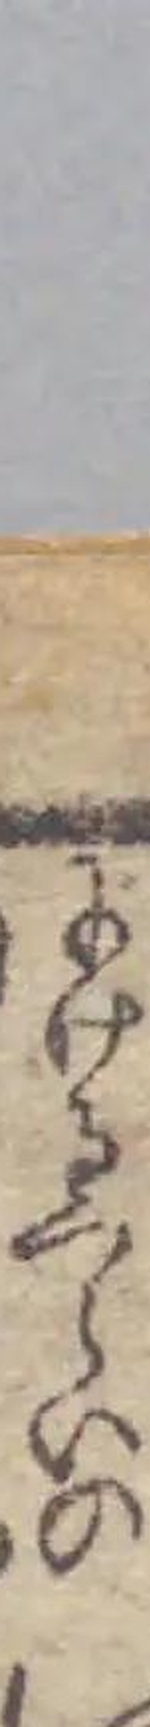にけるくらいの
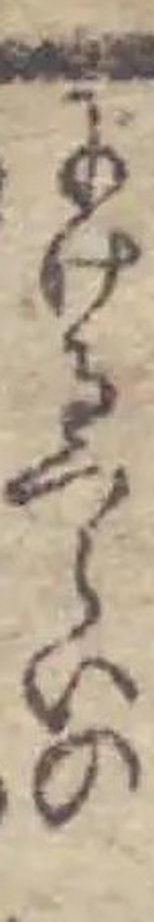にけるくらいの
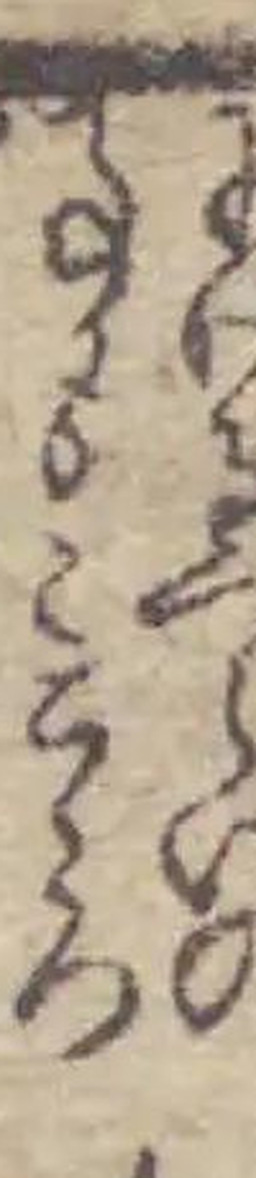事もとこゝろ
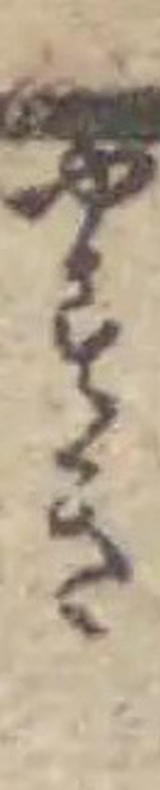やすき
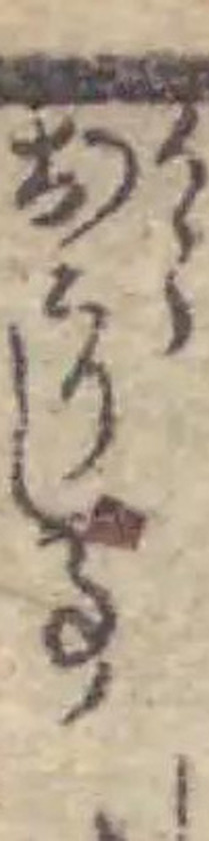おこりし事
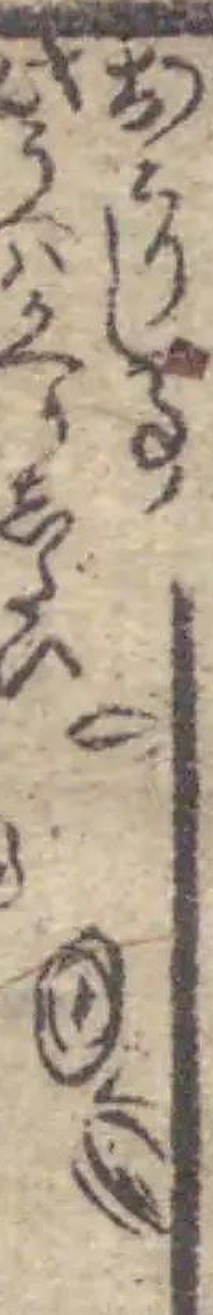此うへはかへりしだい
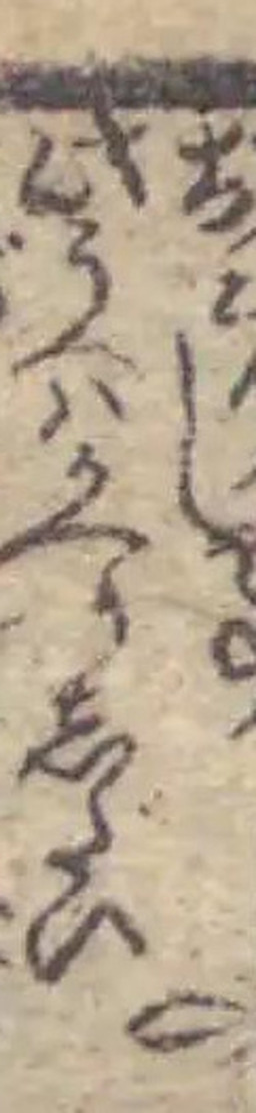此うへはかへりしだい
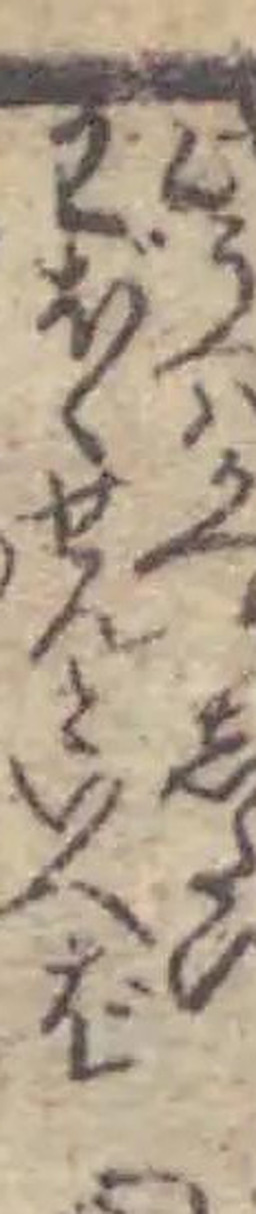わぼくせんといへば
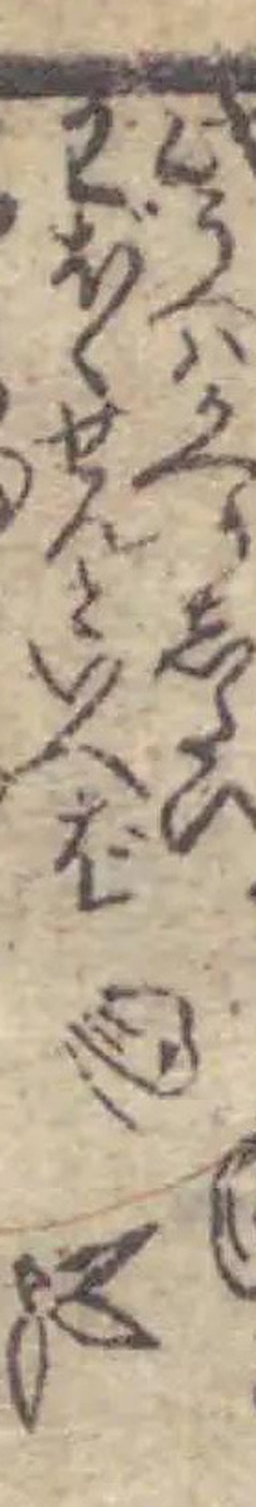わぼくせんといへば
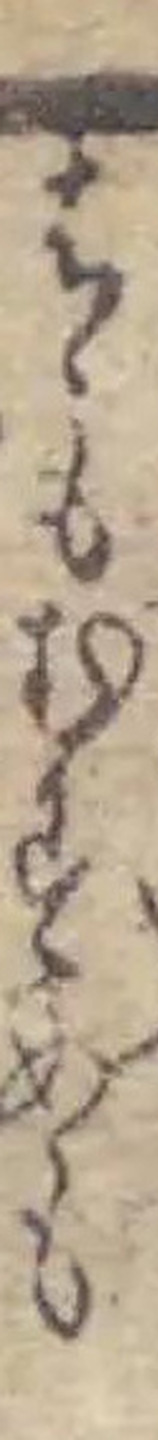はゝもむすめも
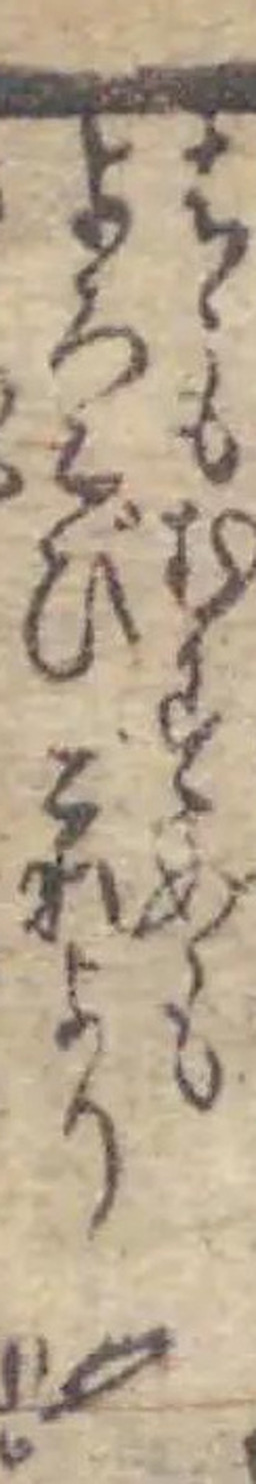よろこびこれより
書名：蟹牛房挟多 3巻
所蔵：国立国会図書館 National Diet Library, JAPAN
